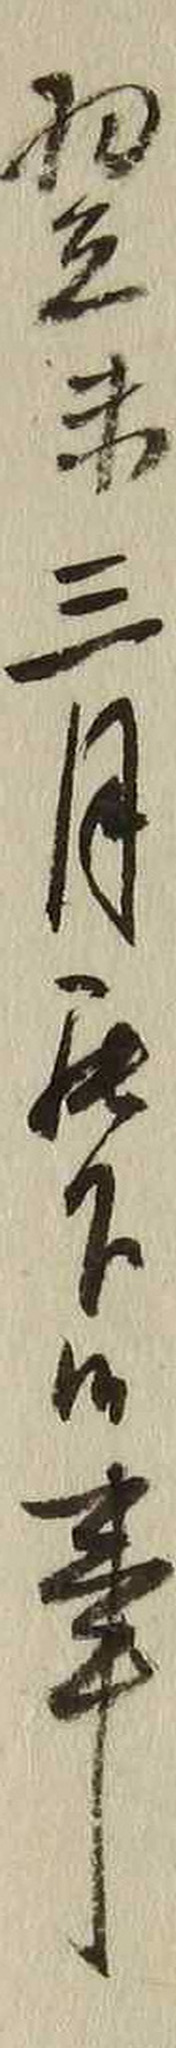翌未三月罷下候事
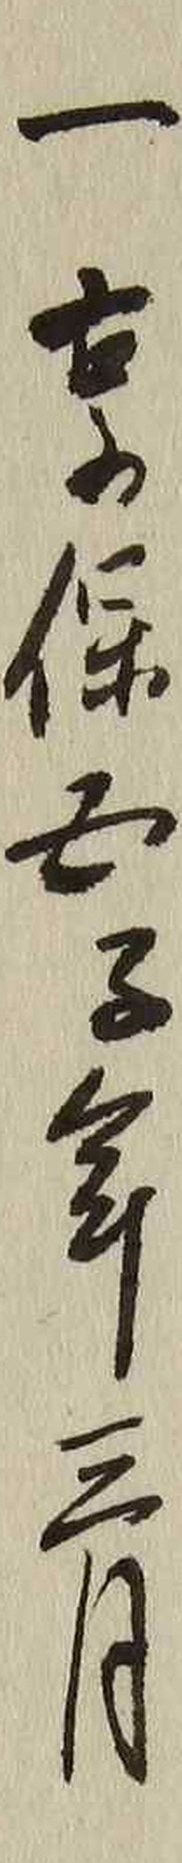一享保五子年三月
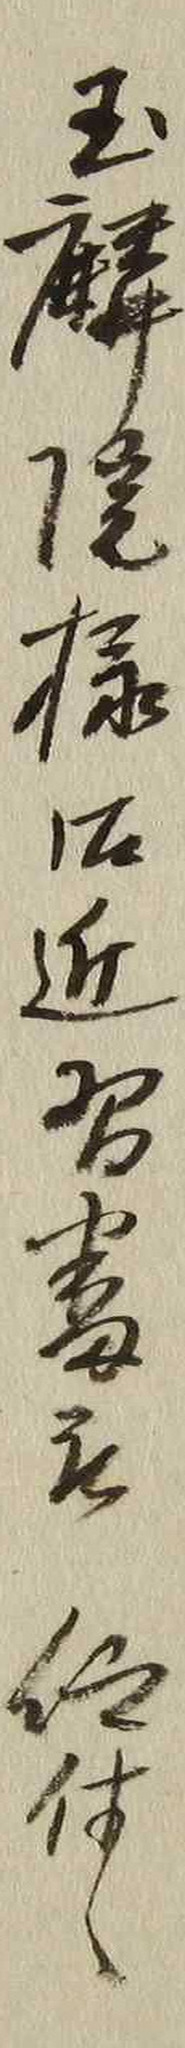玉麟院様御近習番被仰付候
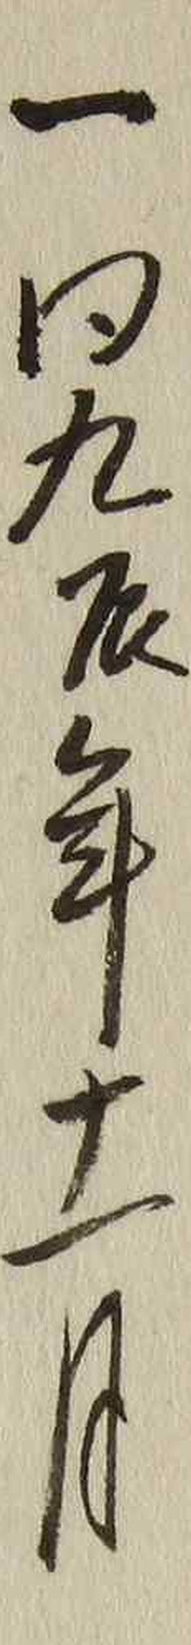一同九辰年十一月
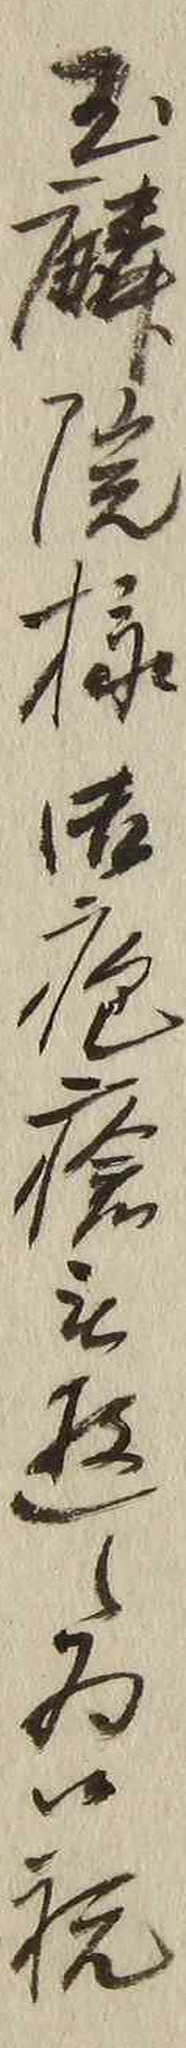玉麟院様御疱瘡被遊候為御祝
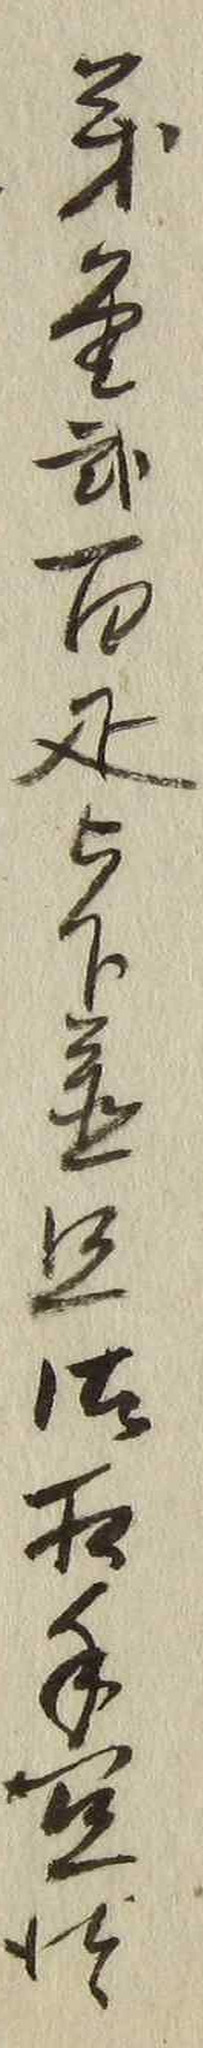義金弐百疋被下置且御相手宜仕候
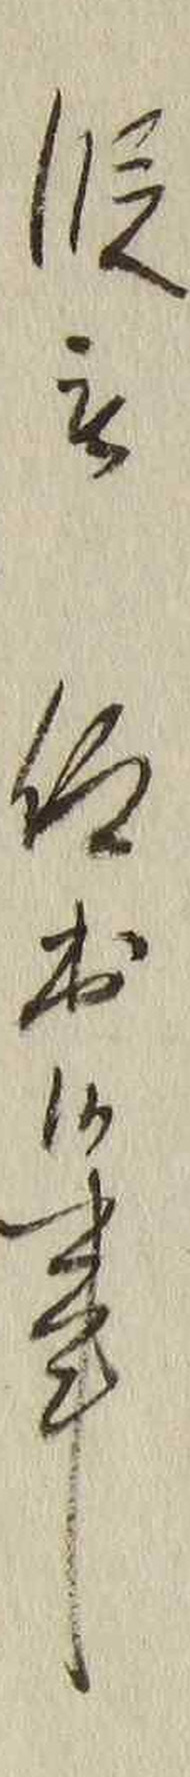段被仰出候事
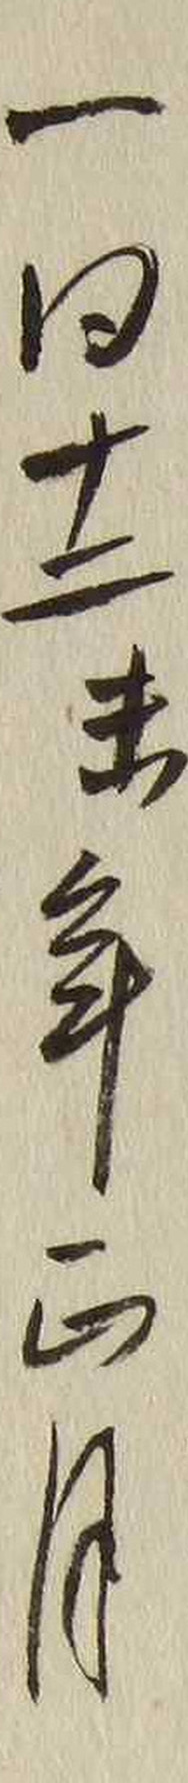一同十二未年正月
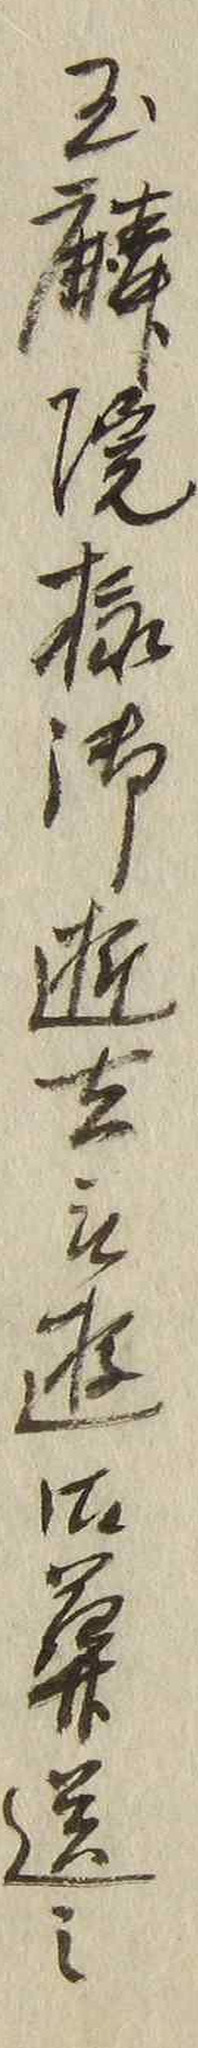玉麟院様御逝去被遊御葬送之
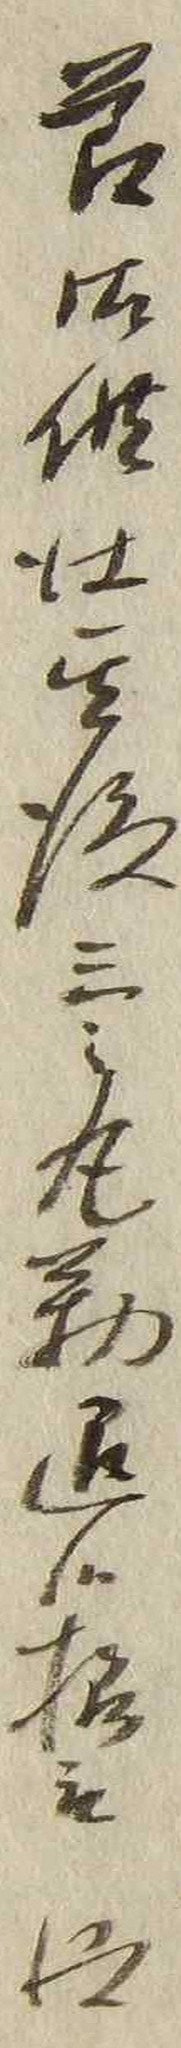節御供仕其後三之丸勤退候様被仰

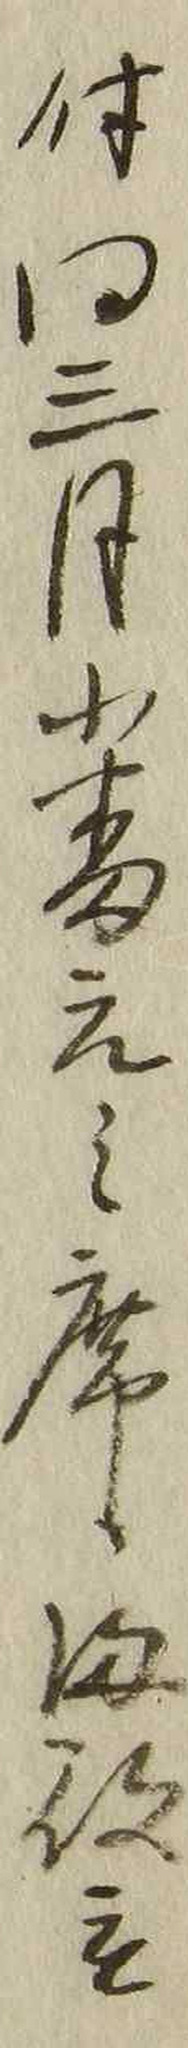付同三月小番元之席へ帰役被
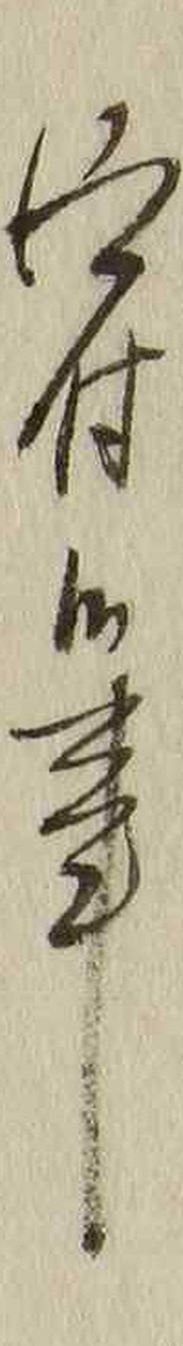仰付候事
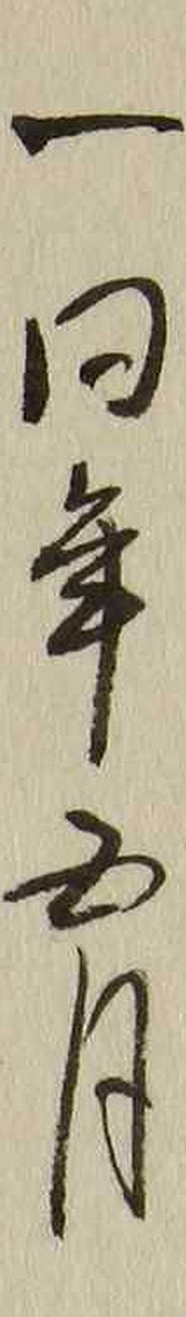一同年五月
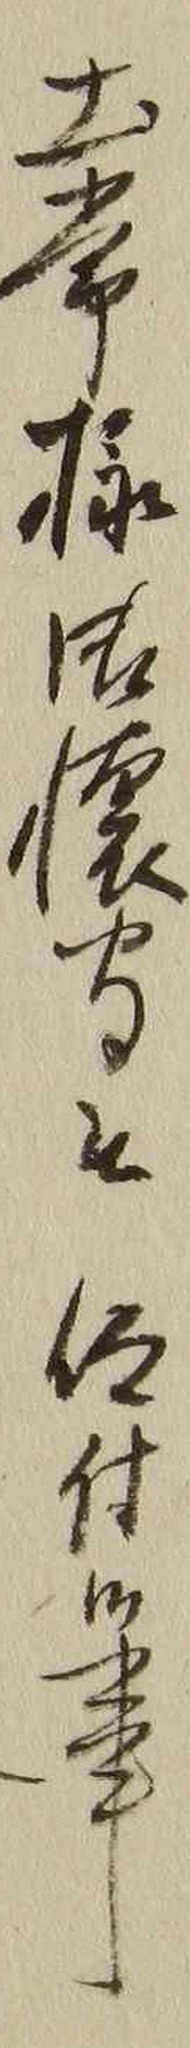土常様御懐守被仰付候事
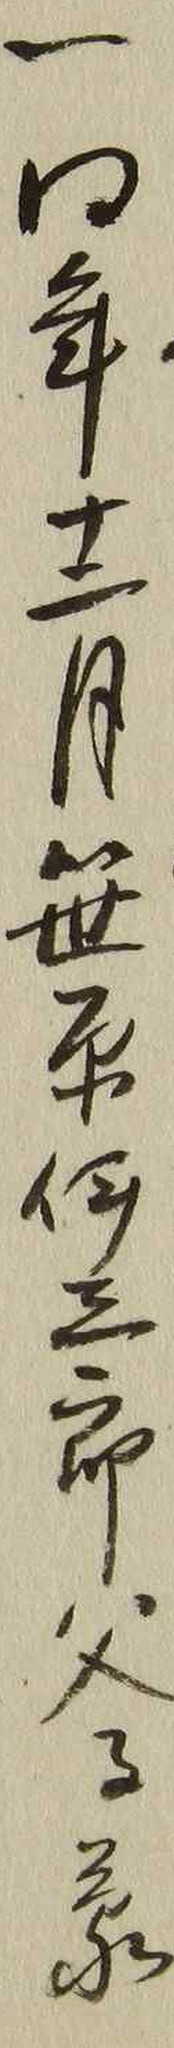一同年十二月笹原伊三郎父子蒙
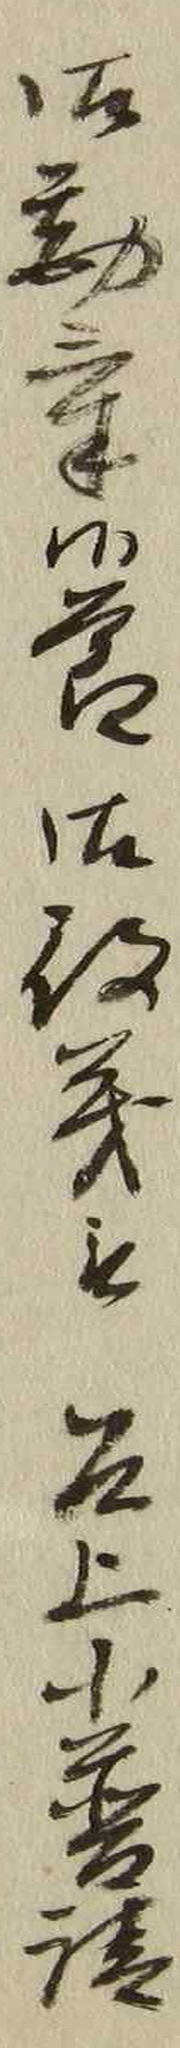御勘気候節御役義被召上小普請
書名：諸士系譜　巻之359　す之部9
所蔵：会津若松市立会津図書館
